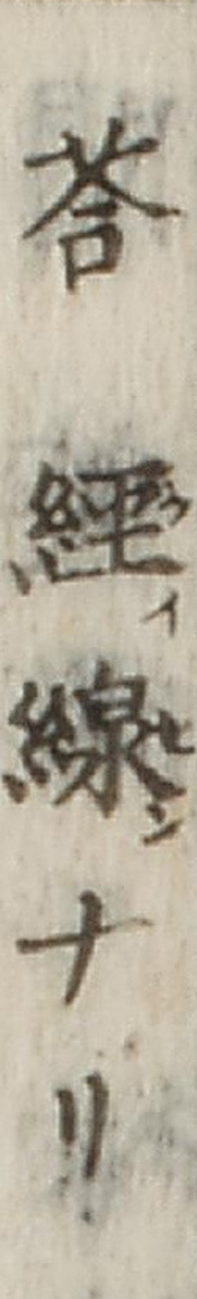答経線ナリ
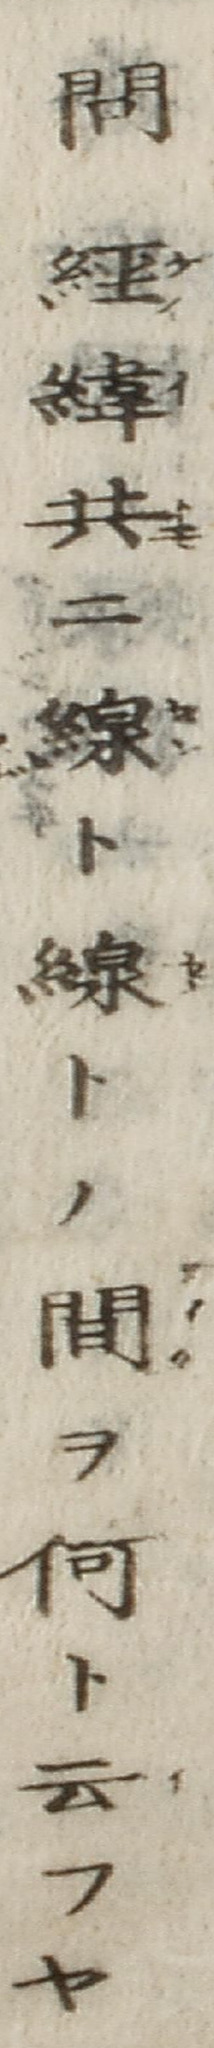問経緯共ニ線ト線トノ間ヲ何ト云フヤ
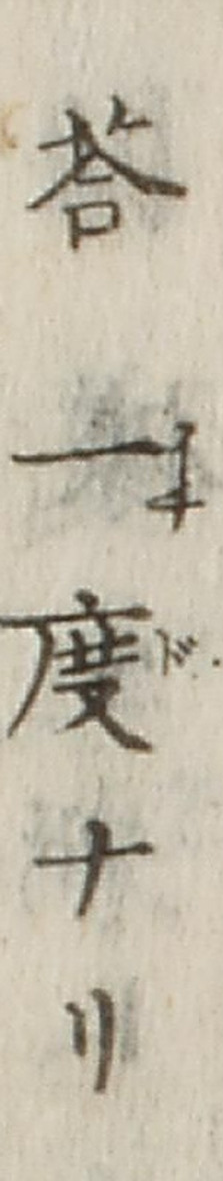答一度ナリ
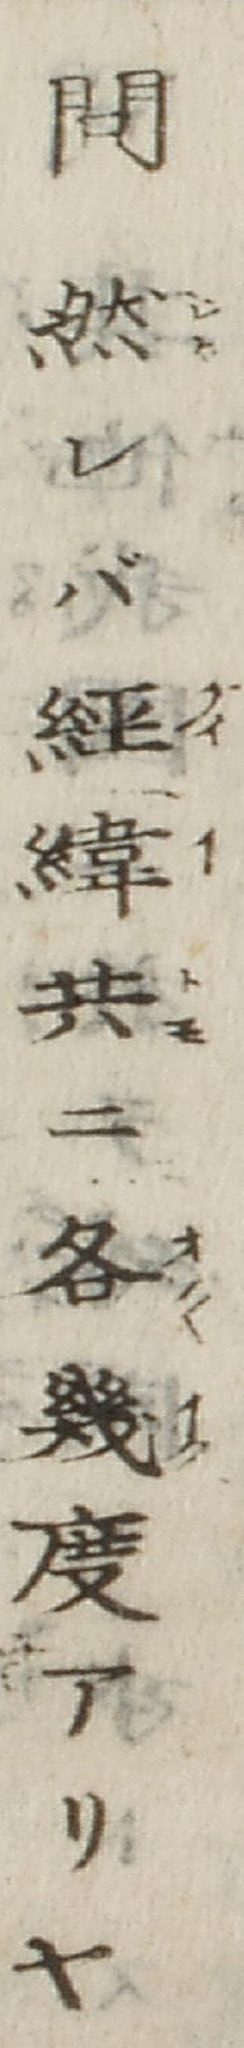問然レバ経緯共ニ各幾度アリヤ
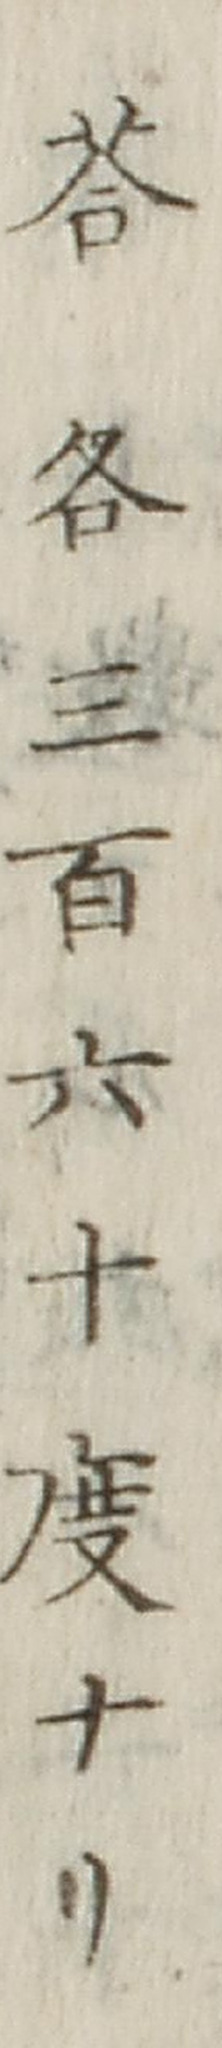答各三百六十度ナリ
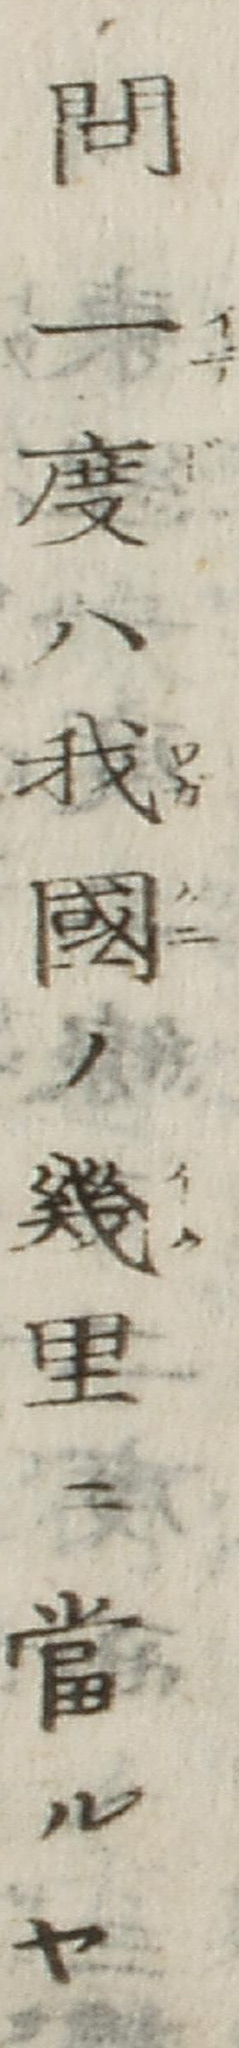問一度ハ我国ノ幾里ニ当ルヤ
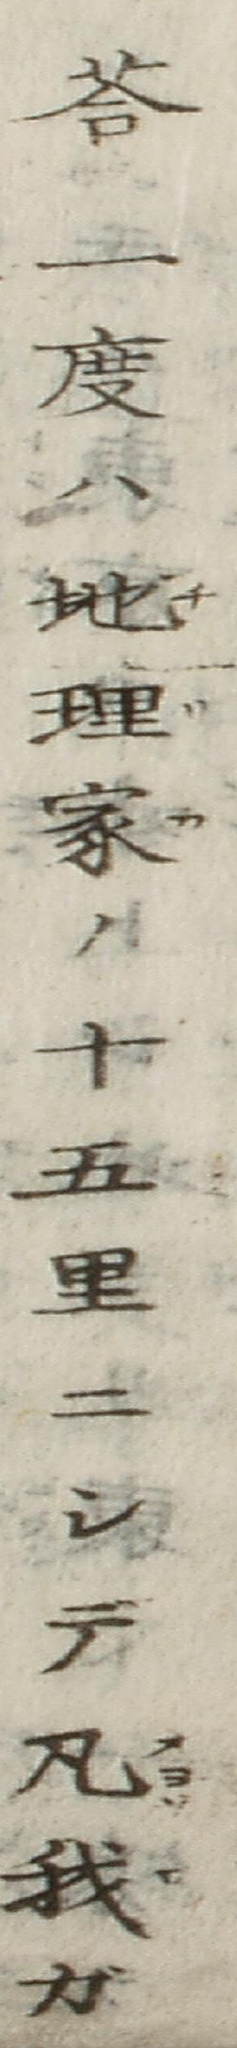答一度ハ地理家ノ十五里ニシテ凡我ガ
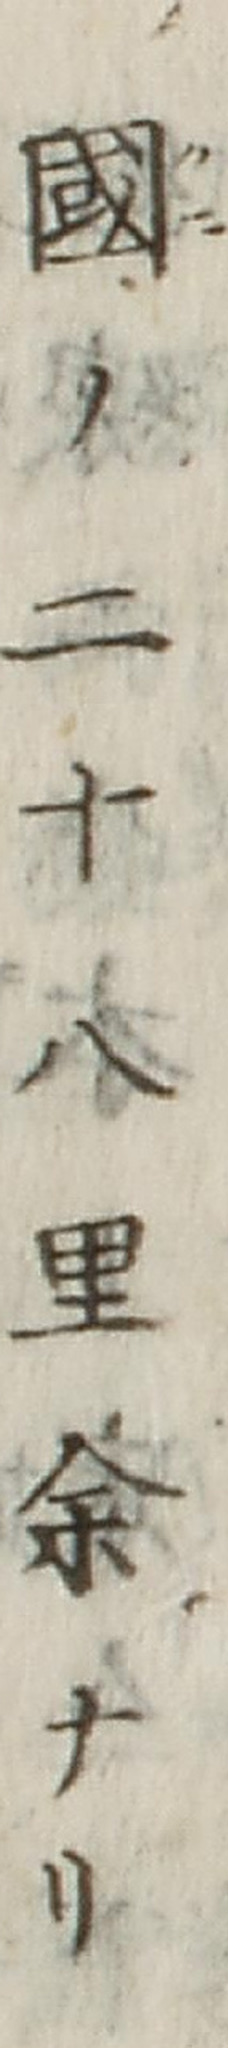国ノ二十八里余ナリ
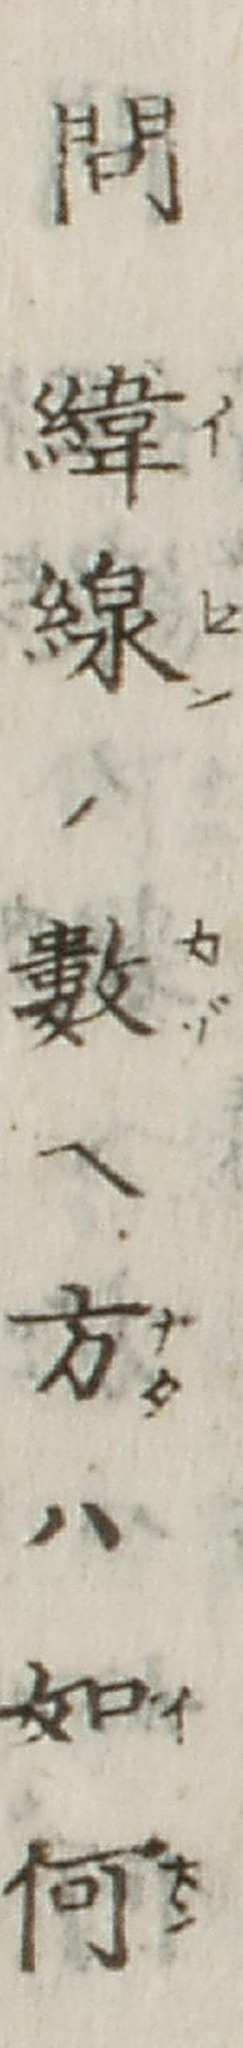問緯線ノ數へ方ハ如何
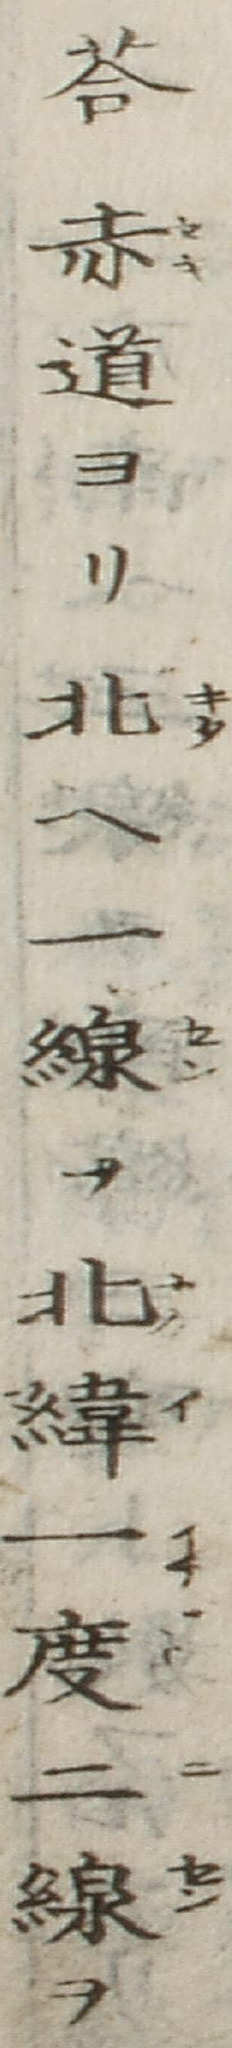答赤道ヨリ北へ一線プ北緯一度二線ヲ

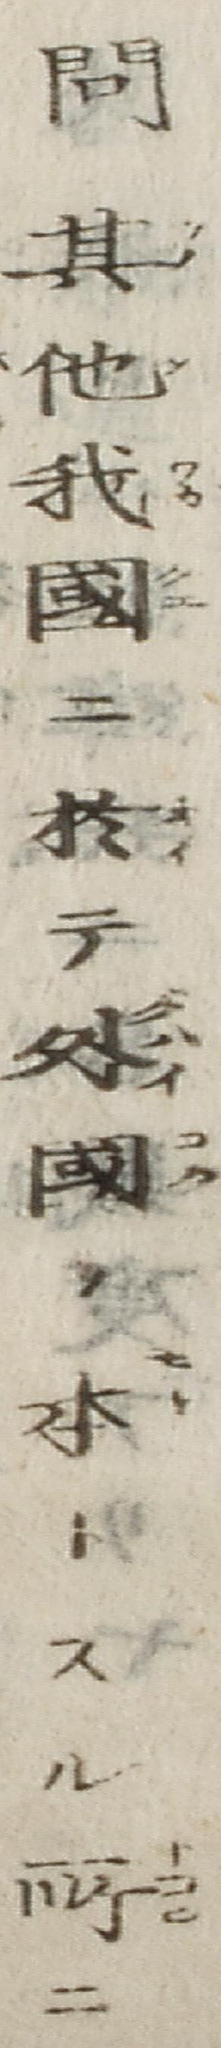問其他我国ニ於テ外国ノ本トスル所ニ
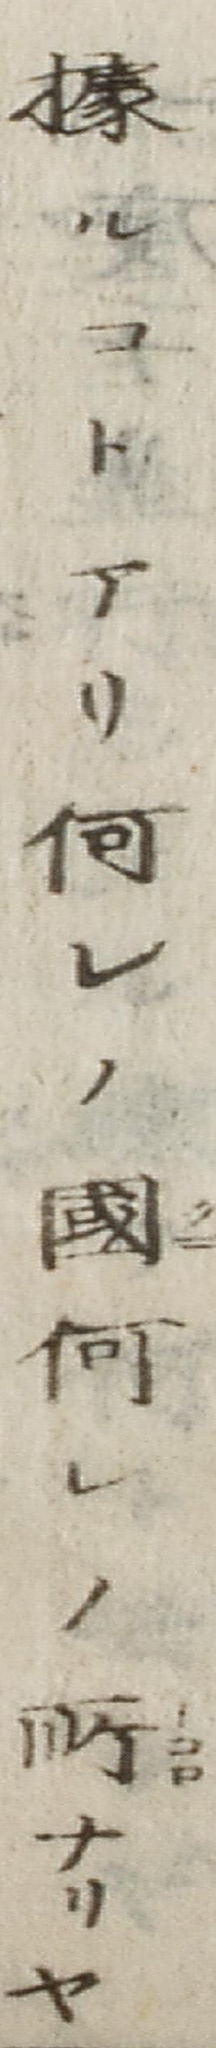据ルコトアリ何レノ国何レノ所ナリヤ
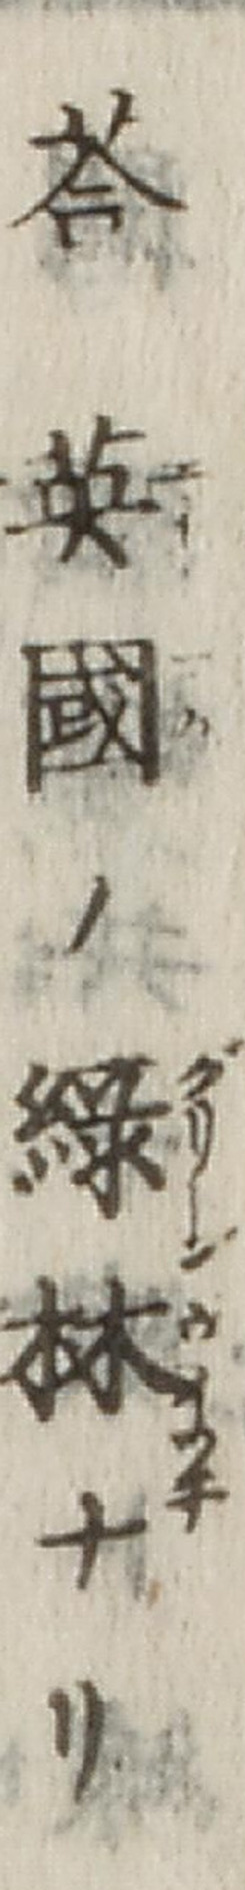答英国ノ緑林ナリ
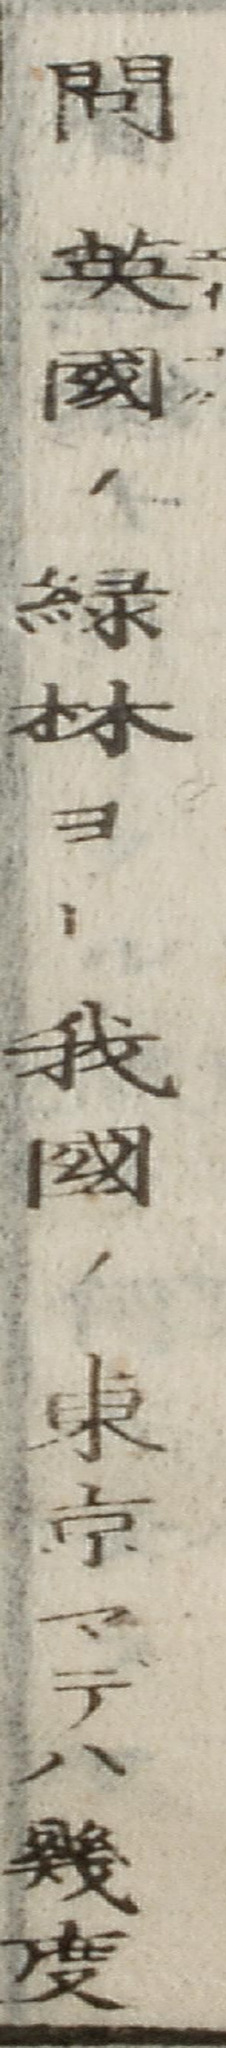問英国ノ緑林ヨト我国ノ東京マテハ幾度
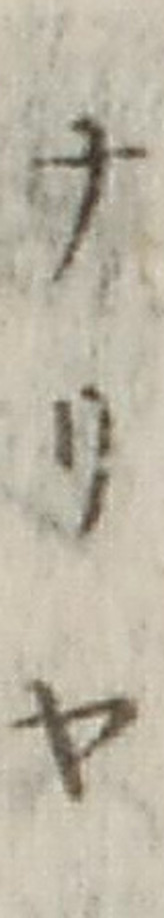ナリヤ
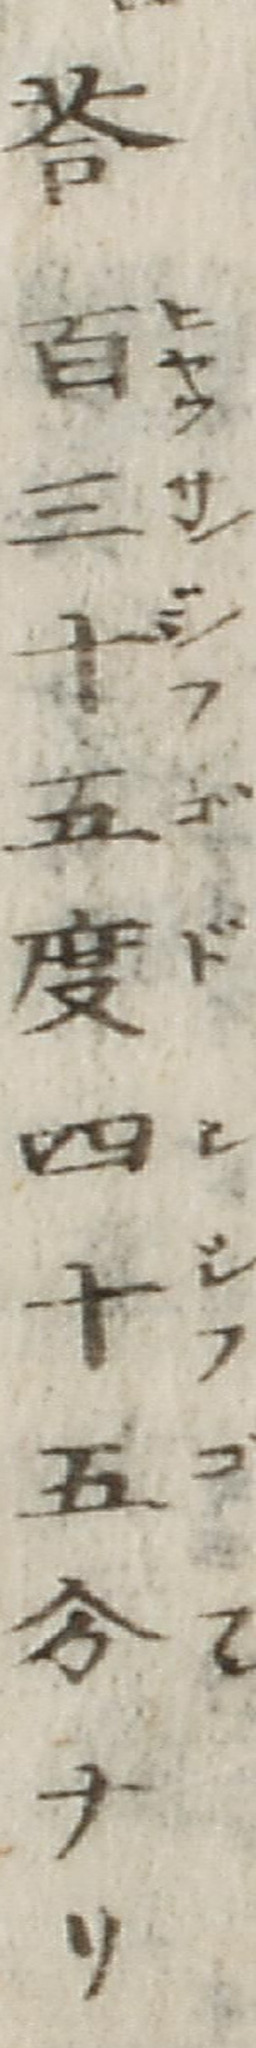答百三十五度四十五分ナリ
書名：地球儀問答　全
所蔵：東京大学地震研究所図書室 Earthquake Research Institute Library, The University of Tokyo, JAPAN
